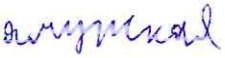амурская
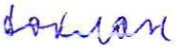боклан
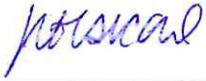рыжая
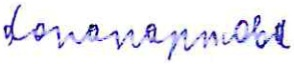бонапартова
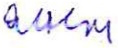аист
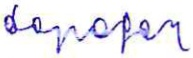бородач
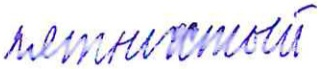пятнистый
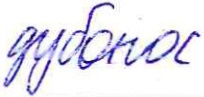дубонос
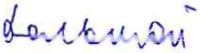большой
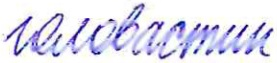головастик
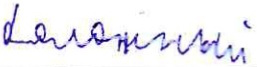болотный
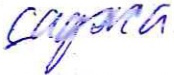саджа
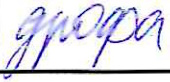дрофа
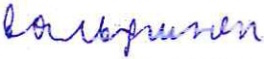вальдшнеп
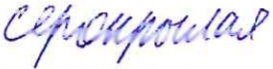серокрылая
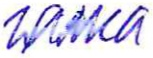галка
